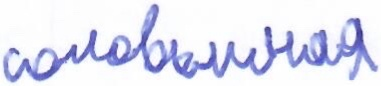соловьимая
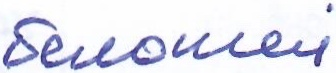белошей
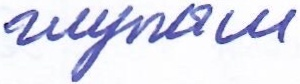глупыш
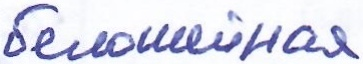белошейная
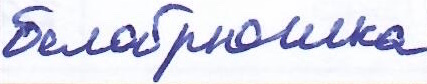белобрюшка
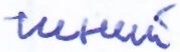синий
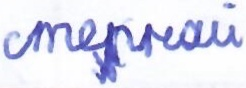стернай
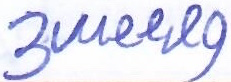змееяд
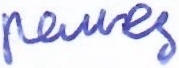ремез
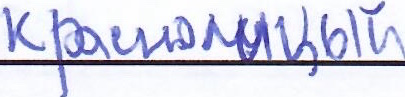краснолицый
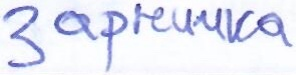зарничка
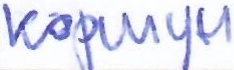коршун
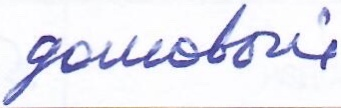домовый
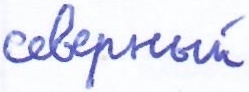северный
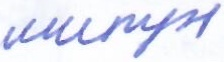шипун
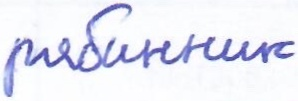рябинник
